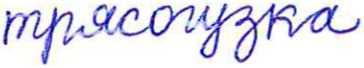трясогузка
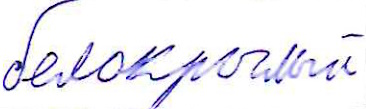белокрылый
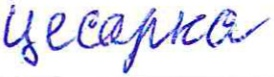цесарка
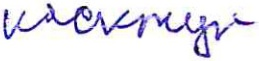клоктун
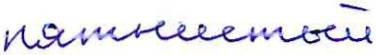пятнистый
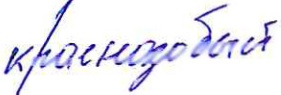краснозобый
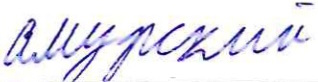амурский
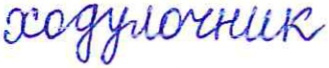ходулочник
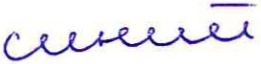синий
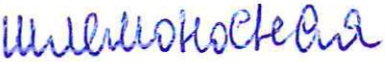шлемоносная
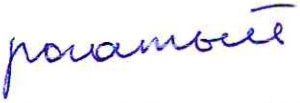рогатый
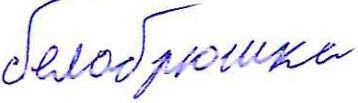белобрюшка
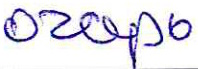огарь
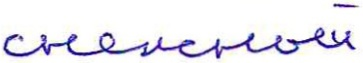снежный
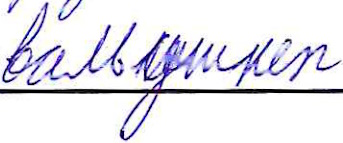вальдшнеп
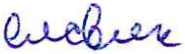еловик
